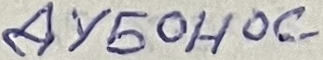дубонос
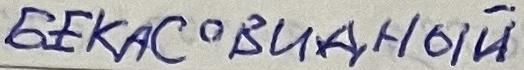бекасовидный
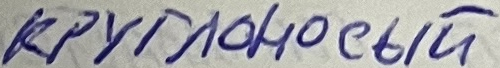круглоносый
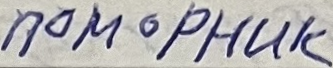поморник
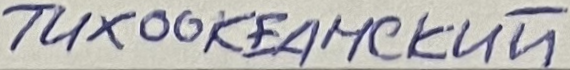тихоокеанский
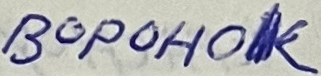воронок
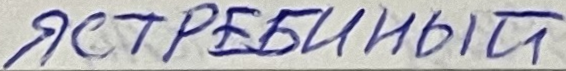ястребиный
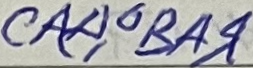садовая
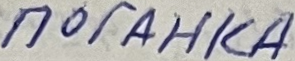поганка
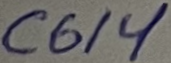сыч
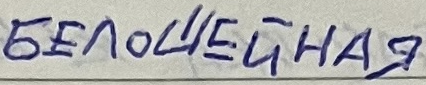белошейная
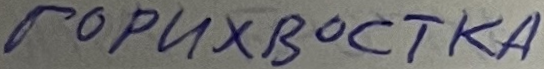горихвостка
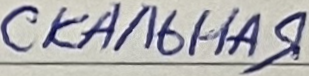скальная
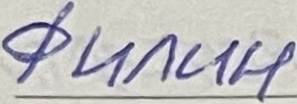филин
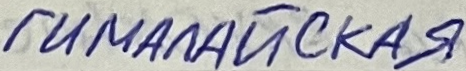гималайская
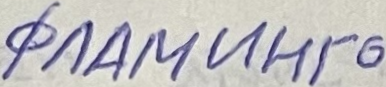фламинго
